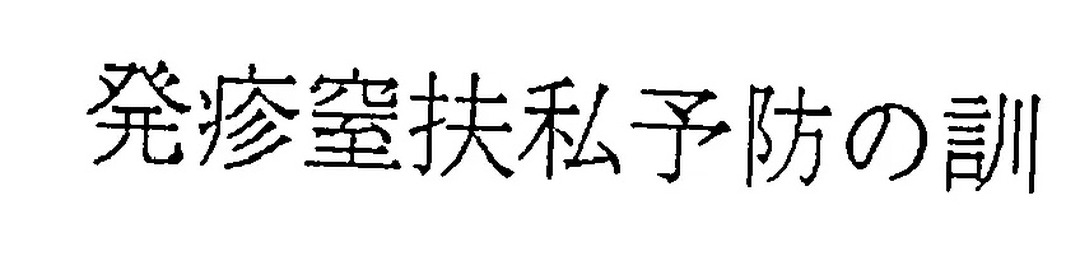発疹窒扶私予防の訓
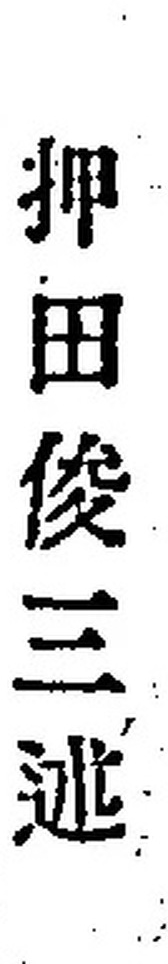押田俊三編
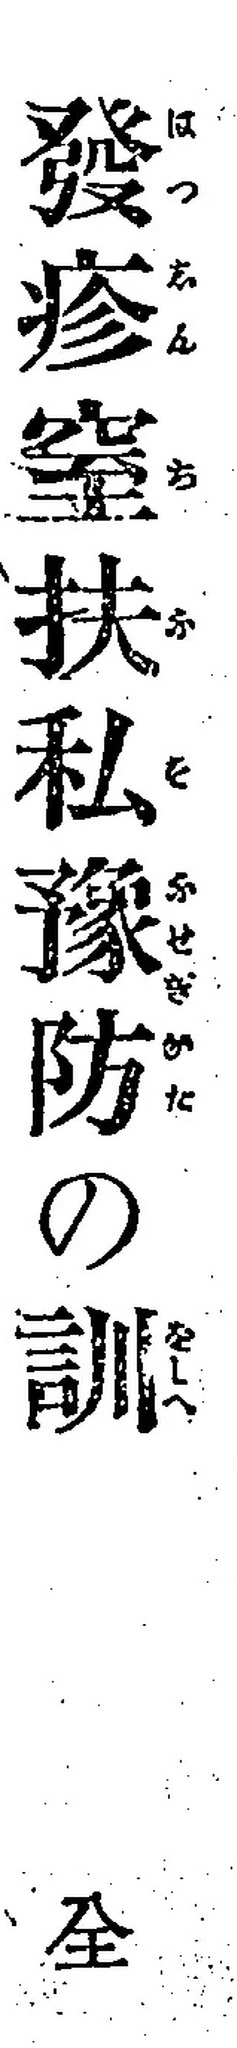發疹窒扶私豫防の訓全
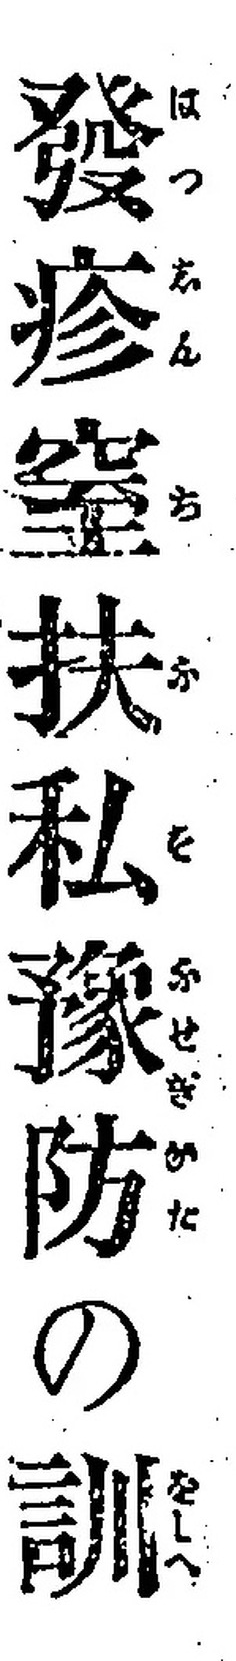發疹窒扶私豫防の訓全

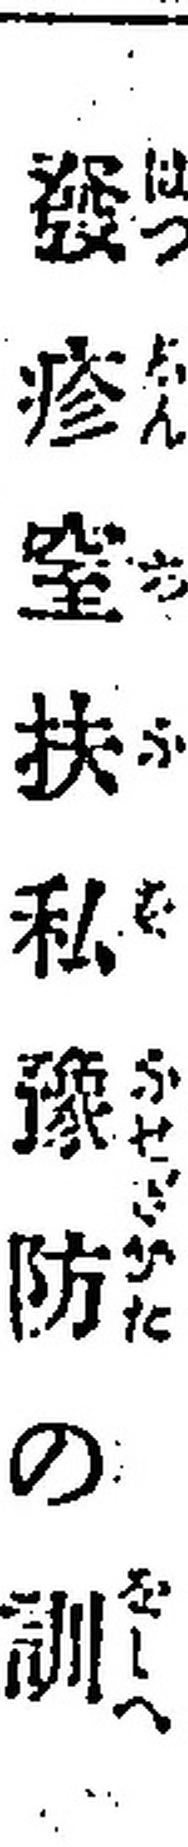發疹窒扶私豫防の訓全
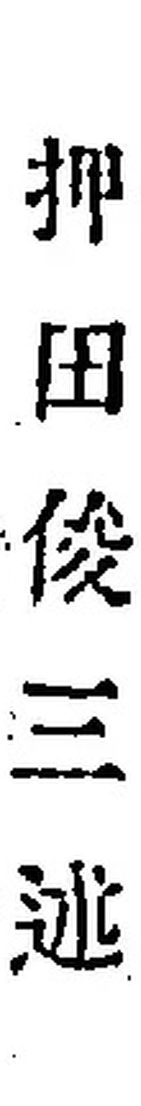押田俊三述
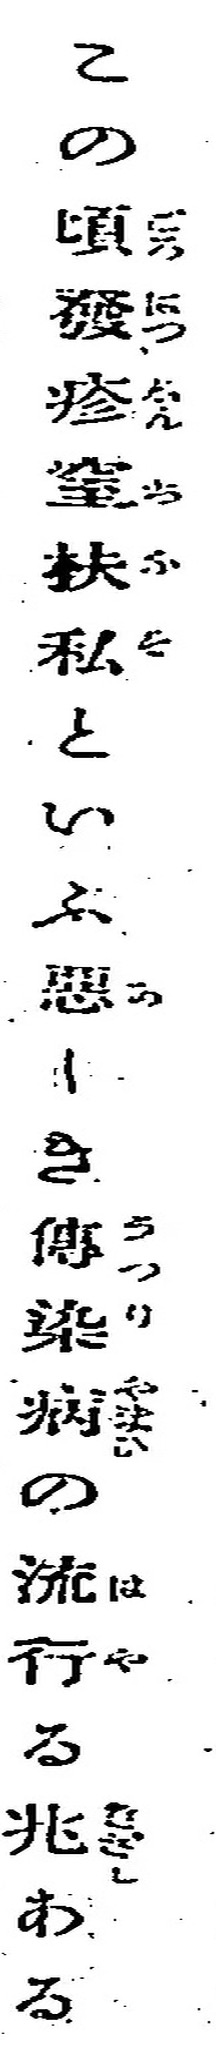この頃発疹窒扶斯といふ悪しき傅染病の流行る兆ある
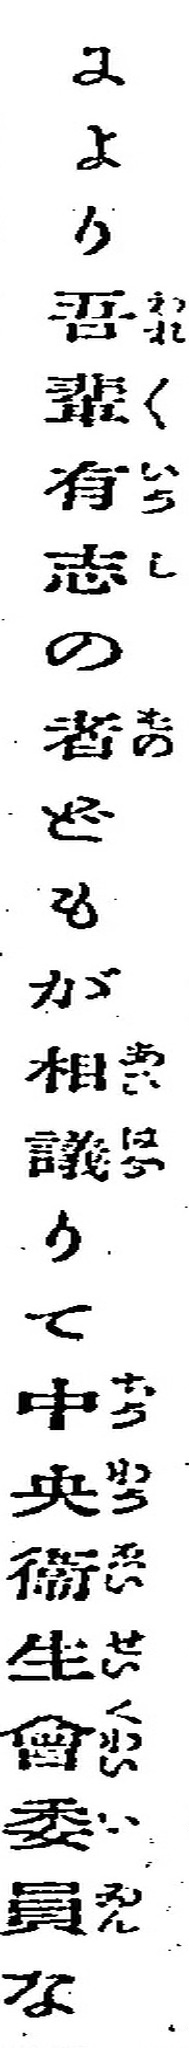により吾輩有志の者どもが相議りて中央衛生會委員な
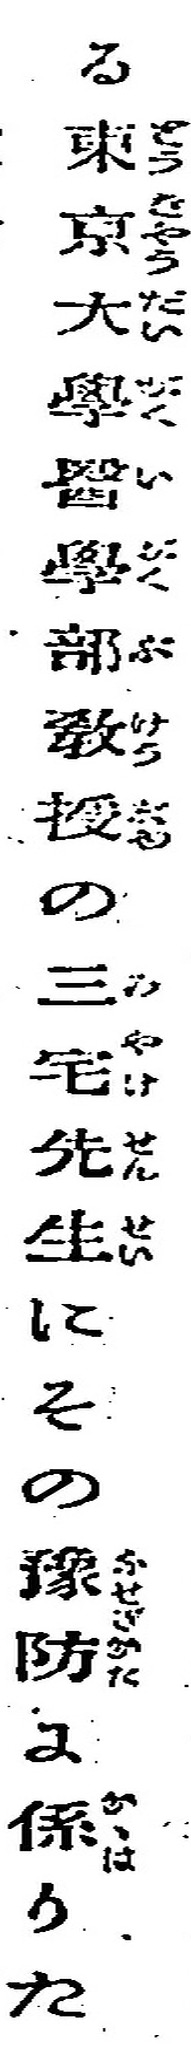る東京大學醫學部教授の三宅先生にその豫防に係りた
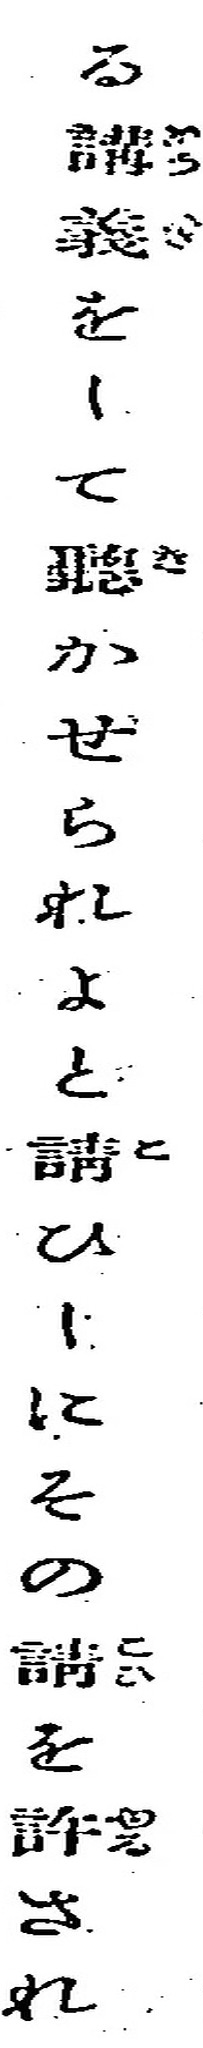る講義をして聽かせられよと請ひしにその請を許され
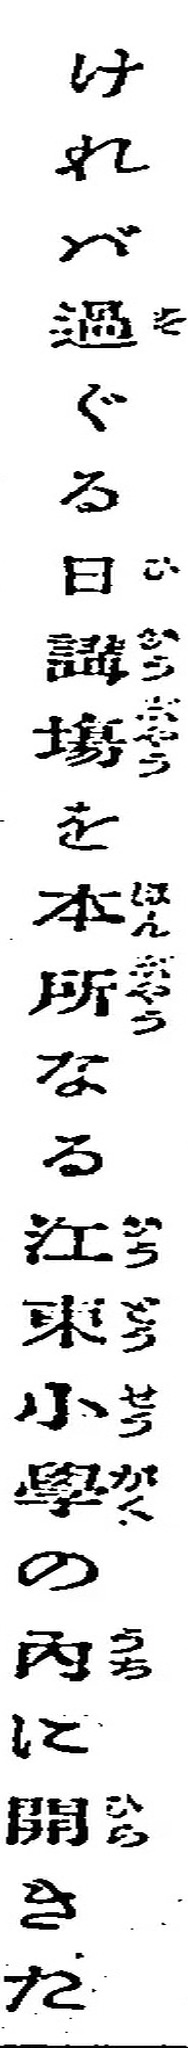ければ過ぐる日講場を本所なる江東小學の内に開きた
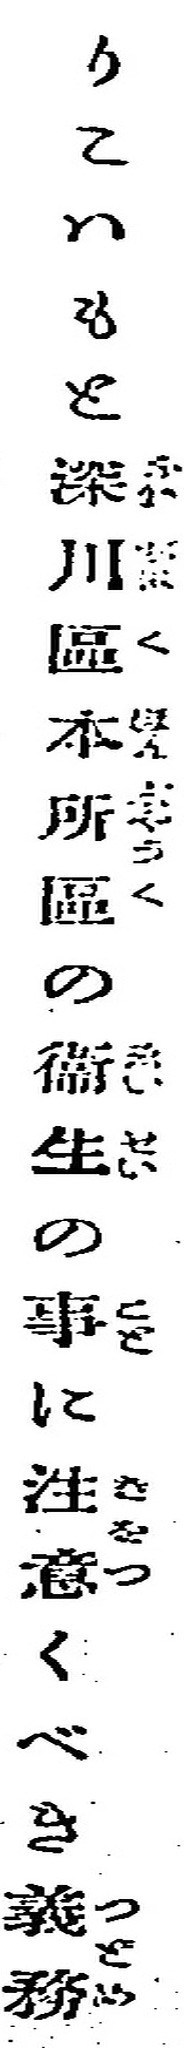りにはもと深川區本所區の衛生の事に注意くべき義務
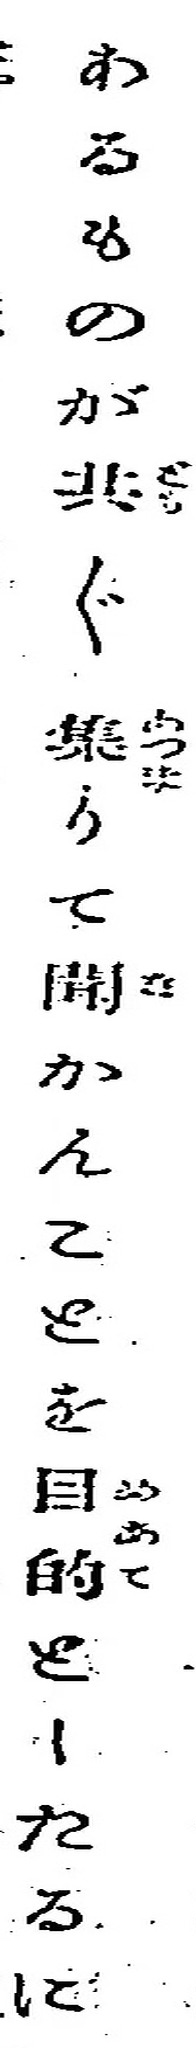あるものが共〴〵集りて聞かんことを目的としたるに
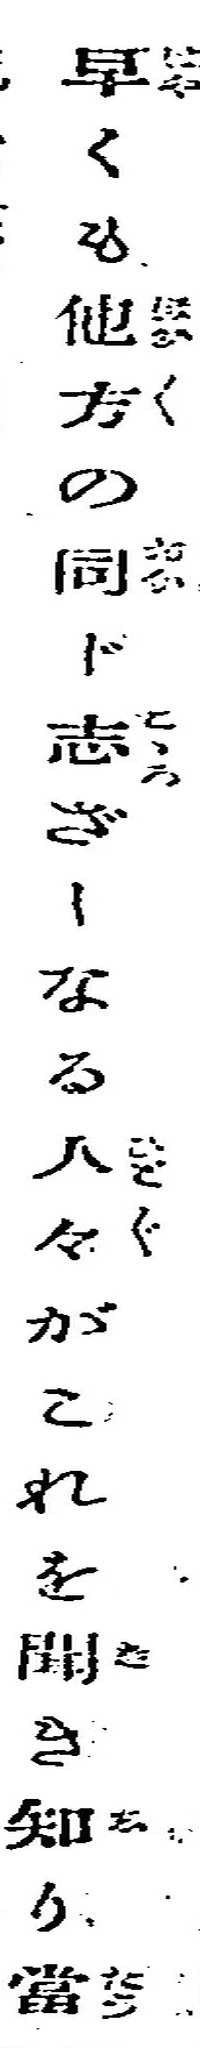早くも他方の同じ志ざしなる人々がこれを聞き知り當
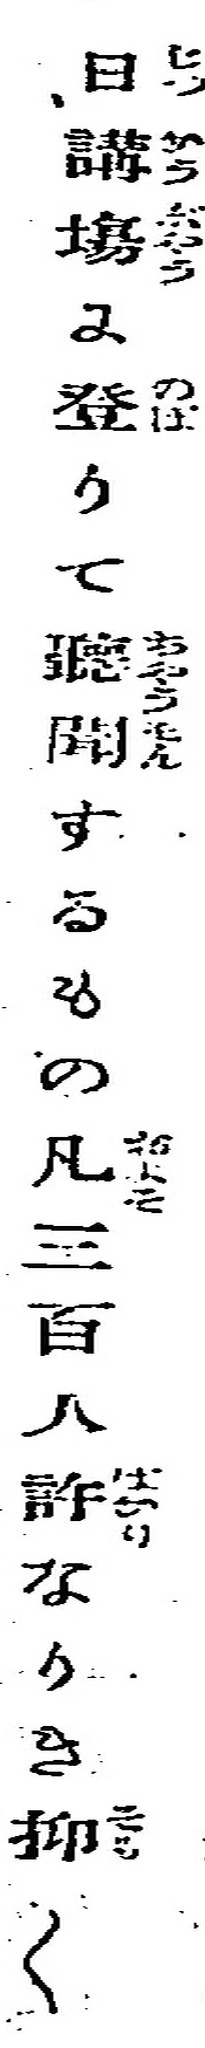日講場に登りて聽聞するもの凡三百人許なりき抑〳〵

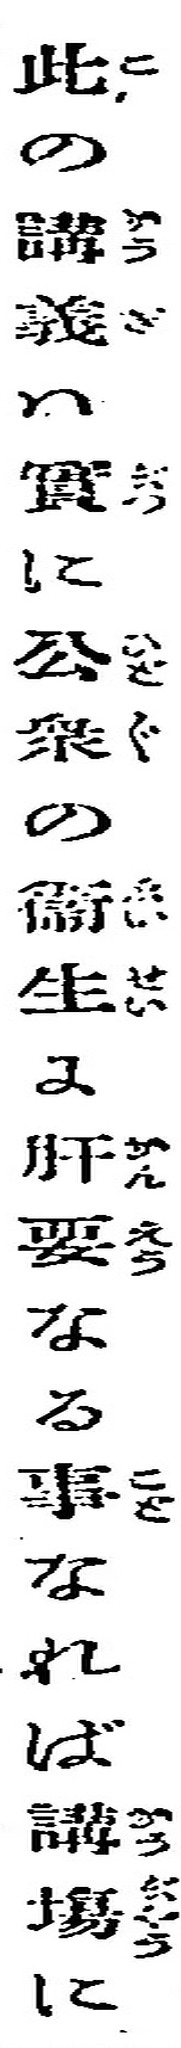此の講義は實公衆の衛生に肝要なる事なれば講場に
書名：発疹窒扶私予防の訓
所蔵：国立国会図書館 National Diet Library, JAPAN
